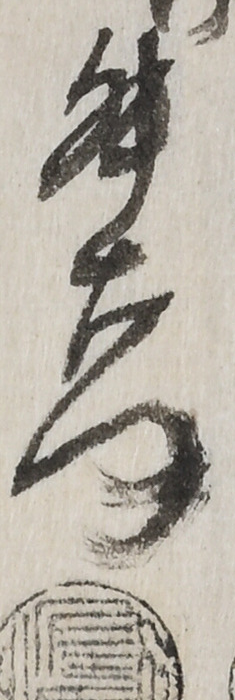升右衛門
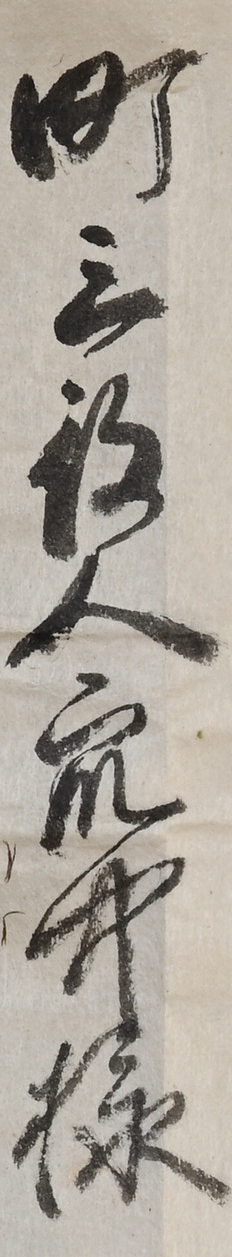町三役人衆中様

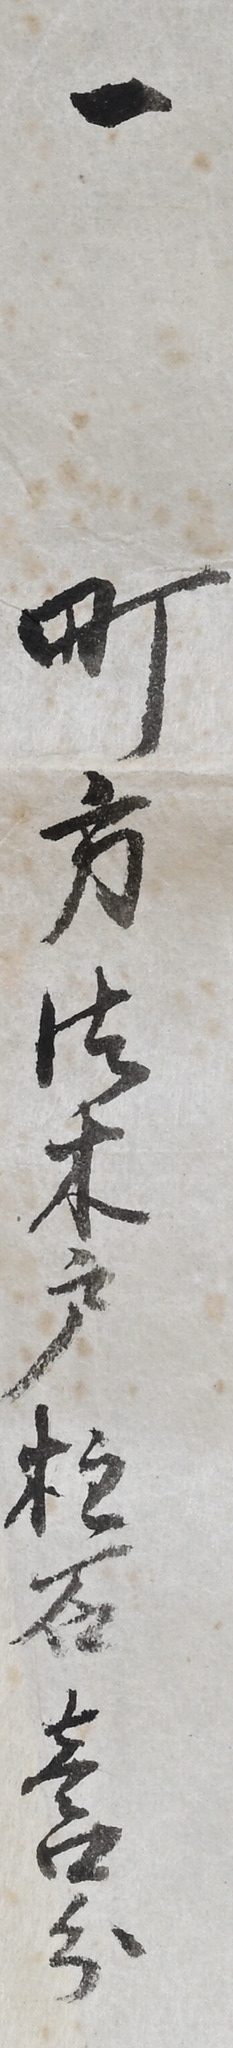一町方御木戸柱石壱口分
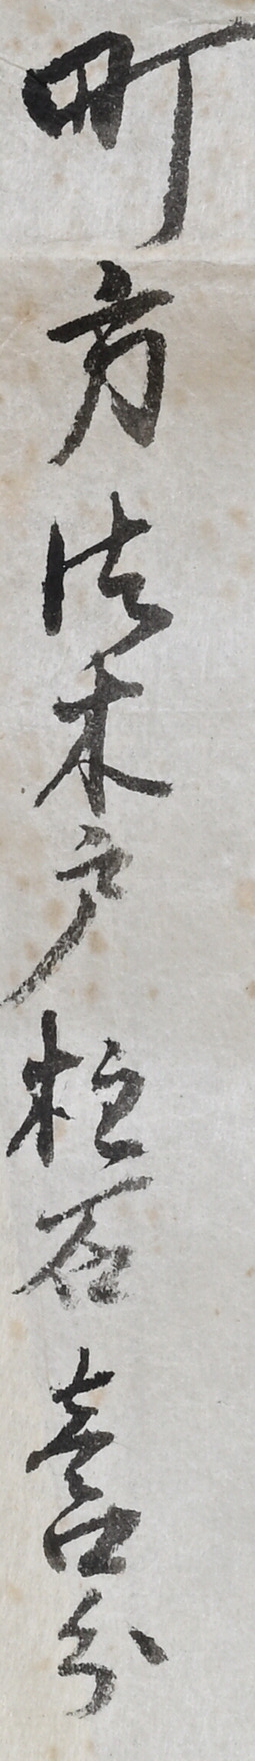一町方御木戸柱石壱口分
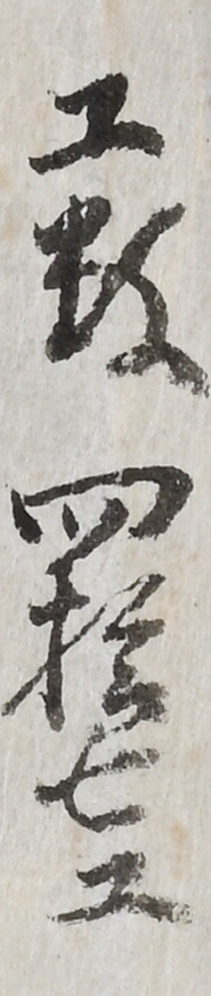工数四拾七工
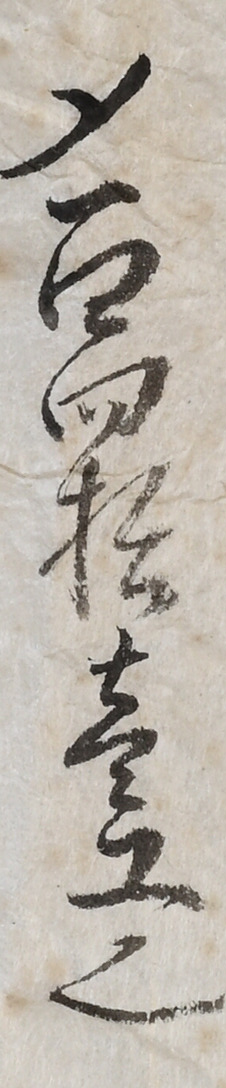〆百四拾壱工也
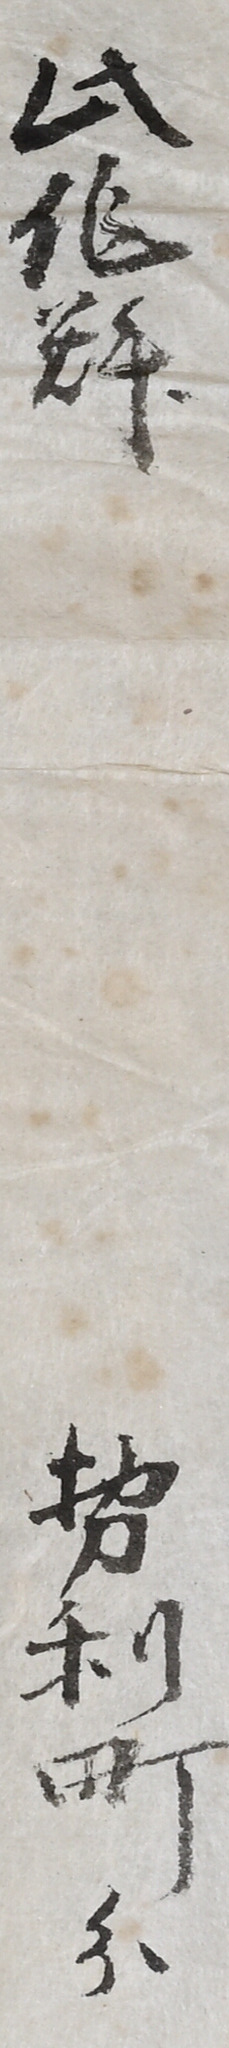此作料勢利町分
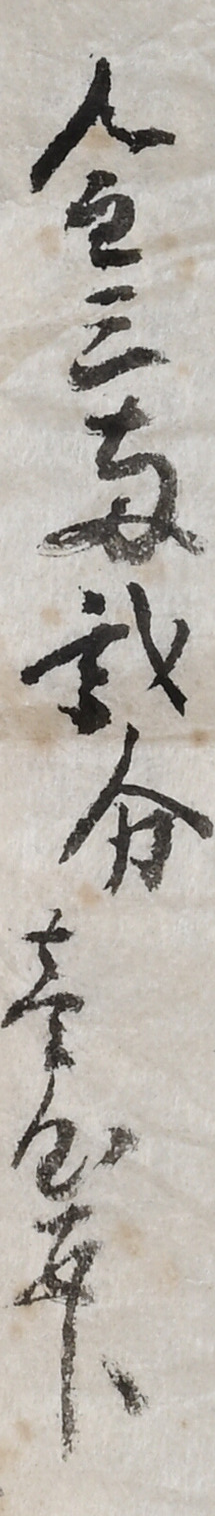金三両弐分清水町分
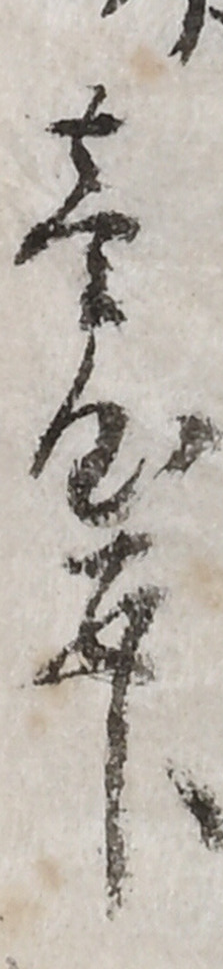壱匁五分
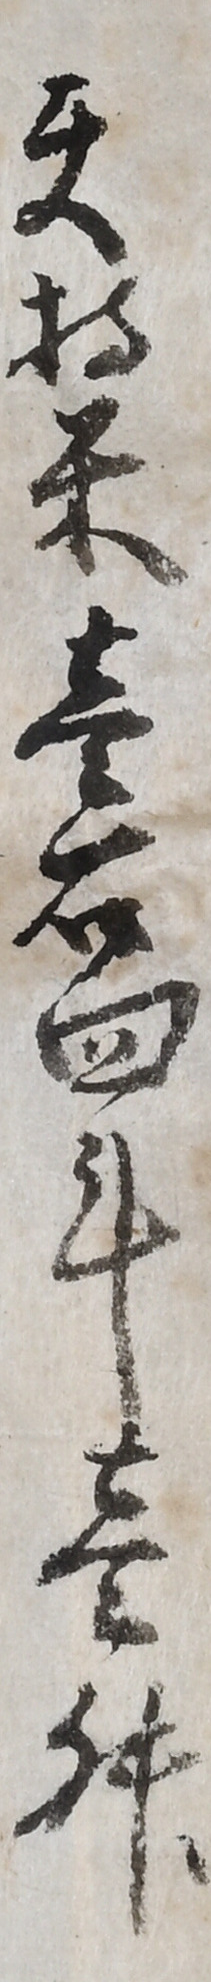夫持米壱石四斗壱升
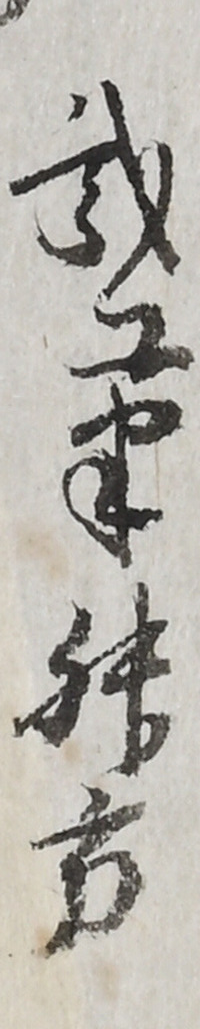弐工半升方
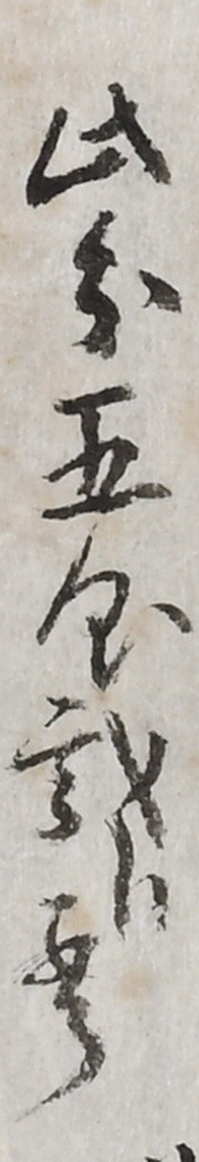此分五匁弐分五厘
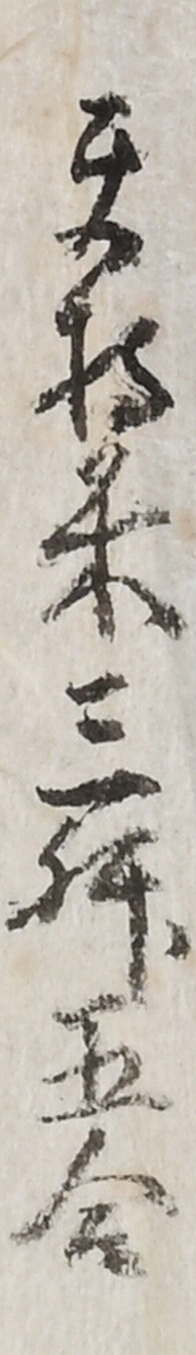夫持米三升五合

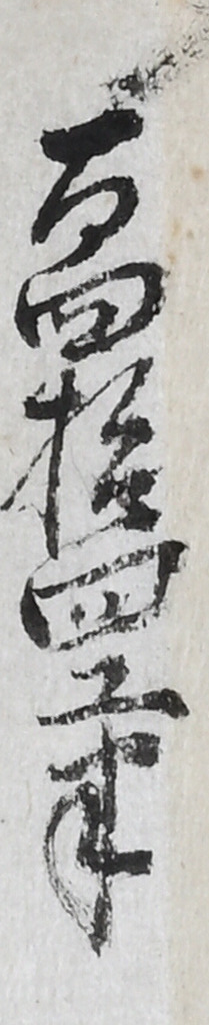百四拾四工半
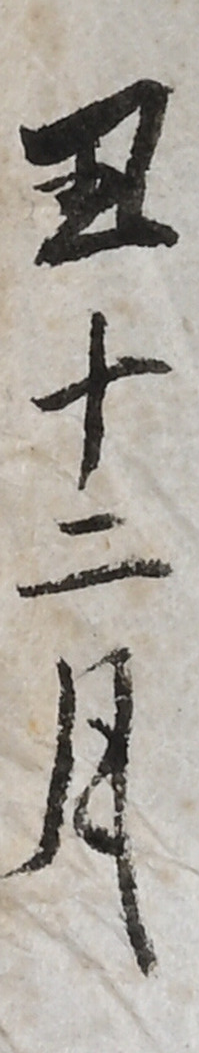丑十二月
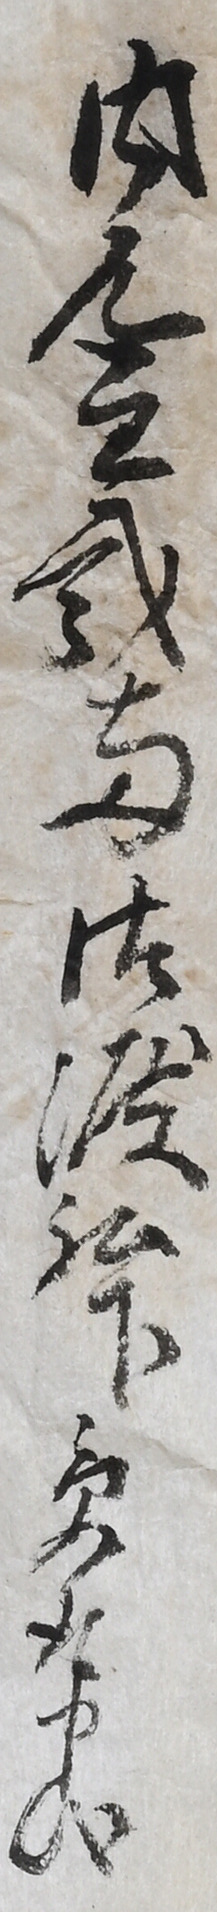内金弐両御渡被下受取申候
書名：町方木戸御普請諸事附（一括）
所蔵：伊那市立高遠町図書館・合同会社AMANE
